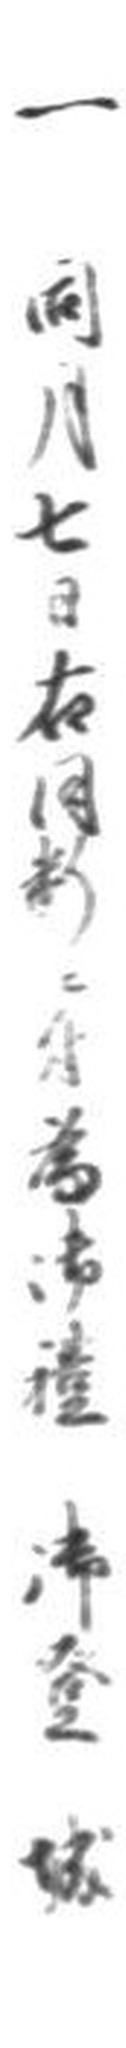一同月七日右同断ニ付為御礼御登城
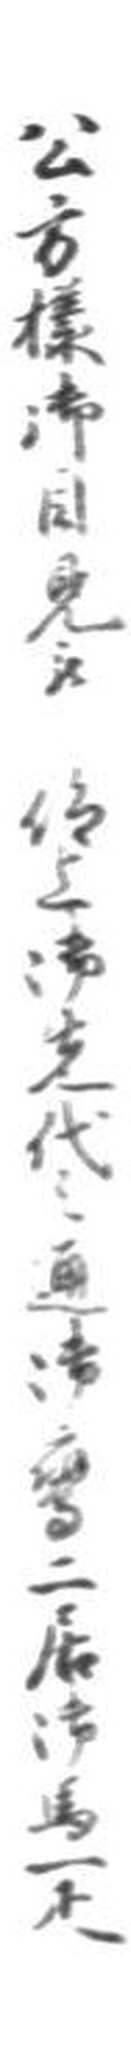公方様御目見被仰上御先代之通御鷹二居御馬一疋
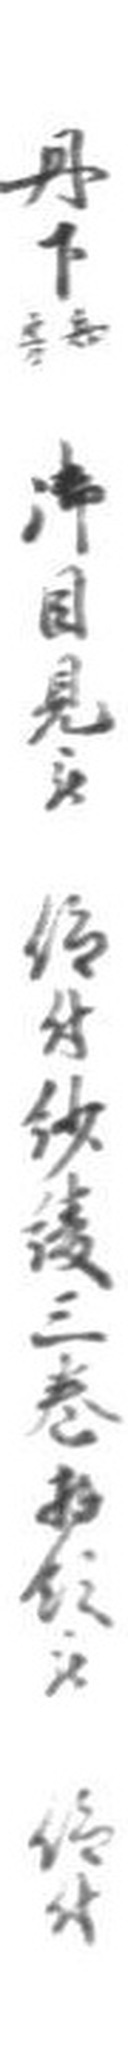房御目見被仰付紗綾三巻拝領被仰付
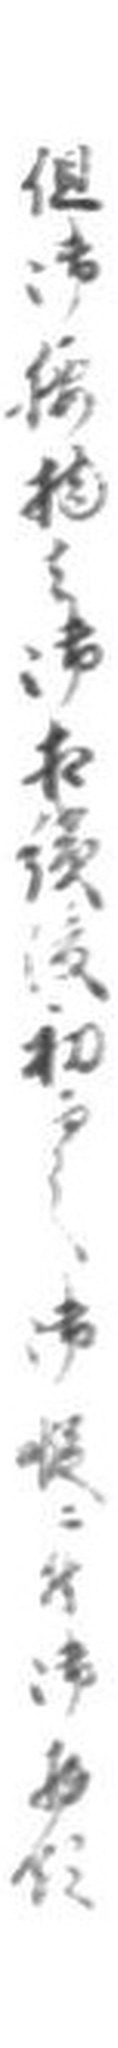但御腰物者御相続後初而之御暇ニ付御拝領
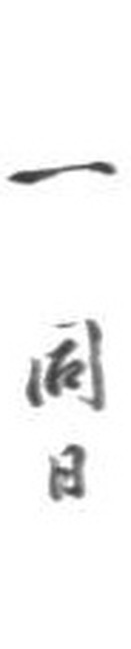一同日

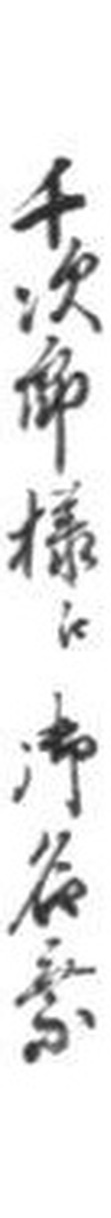千次郎様江御名乗
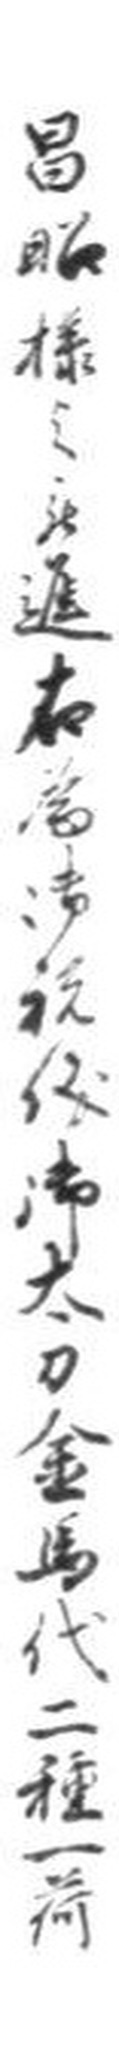昌昭様与被進右為御祝儀御太刀金馬代二種一荷
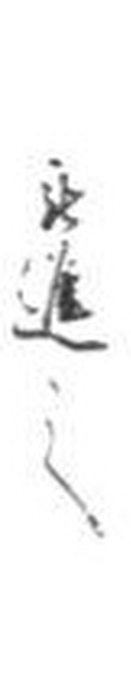被進之
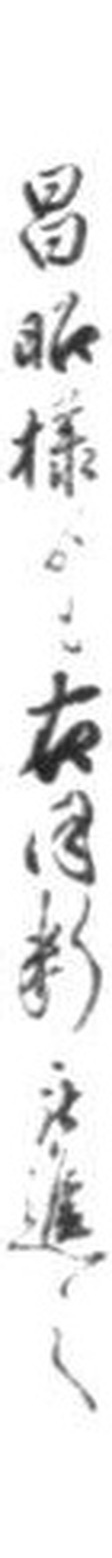昌昭様ゟも右同断被進之
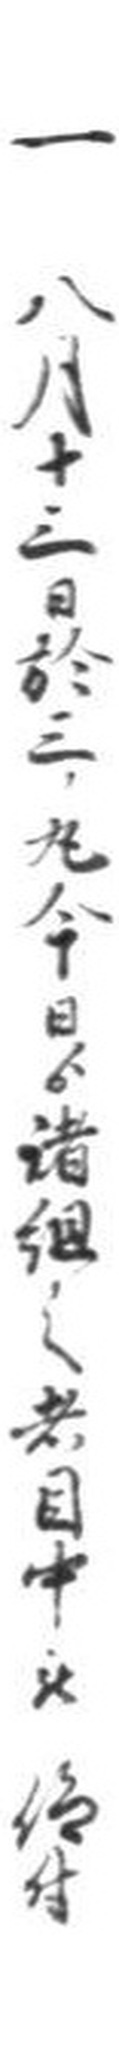一八月十三日於三ノ丸今日ゟ諸組之者目中被仰付
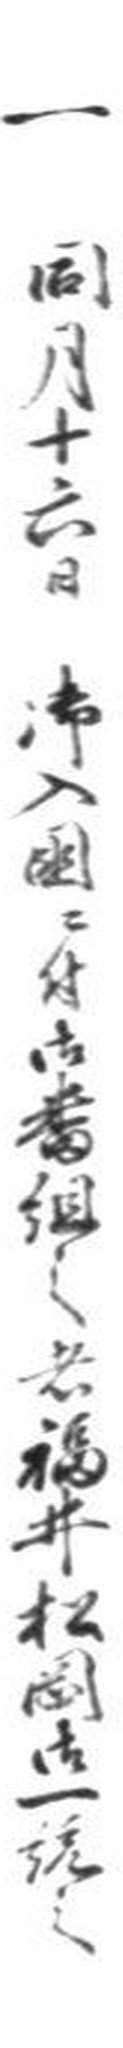一同月十六日御入国ニ付御番組之者福井松岡御一統之
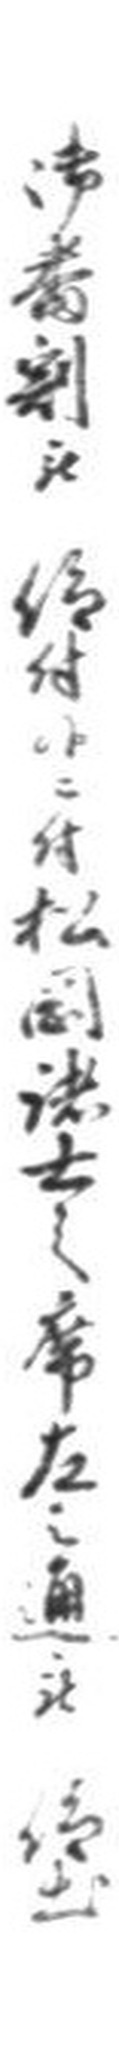御番割被仰付候ニ付松岡諸士之席左之通被仰出
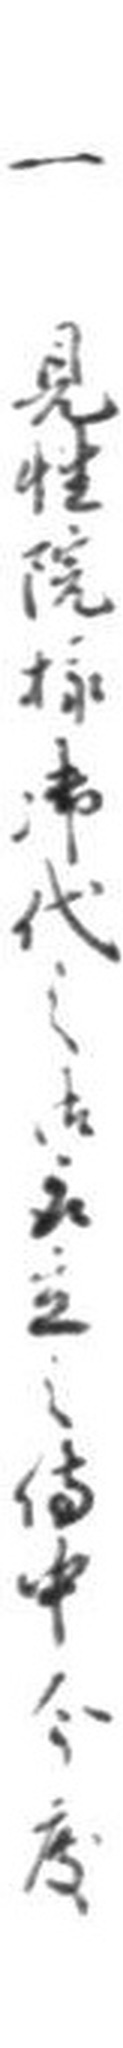一見性院様御代之御取立之侍中今度
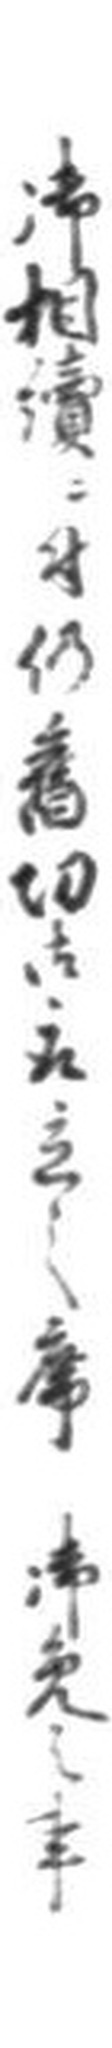御相続ニ付仍旧功御取立之席御免之事
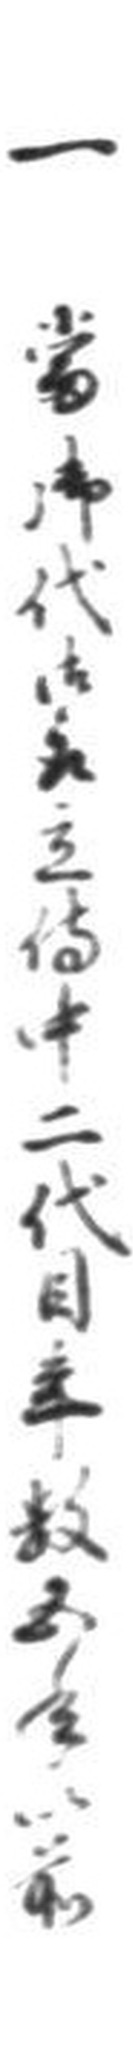一当御代御取立侍中二代目年数五年以前
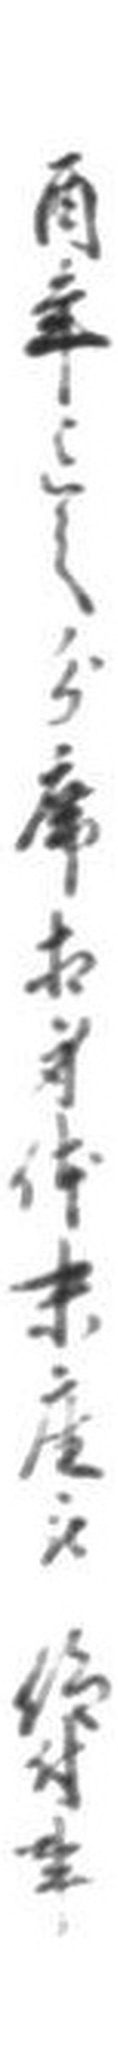酉年迄之分席相身体末座被仰付事
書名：家譜 三十五 宗昌公 従享保六年到同七年
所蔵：福井県文書館 Fukui Prefectural Archives
